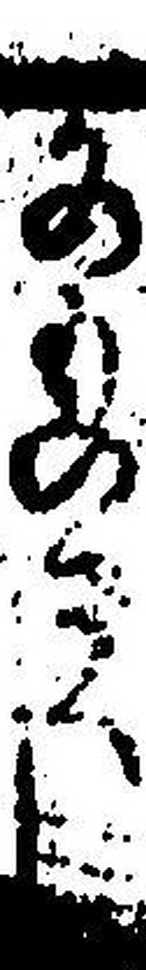かのものさへ
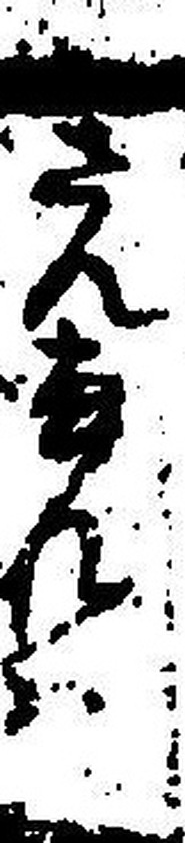さんなれは
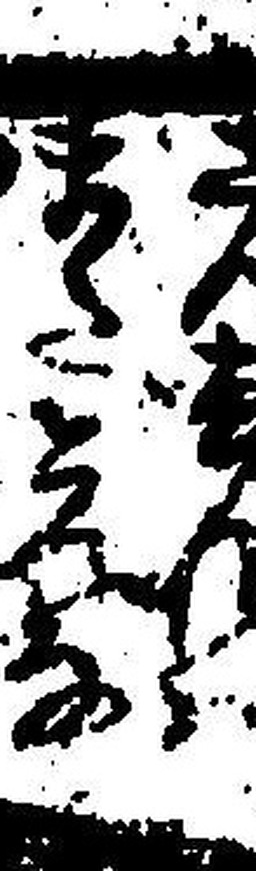またとんな
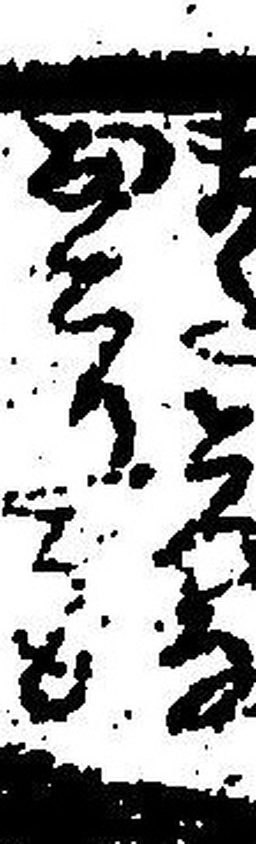おこりても
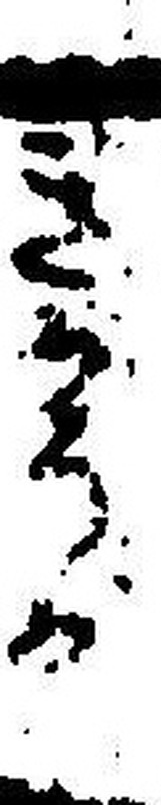きかうが
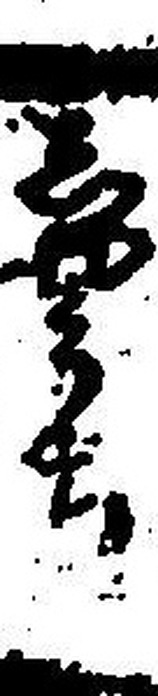しやうち
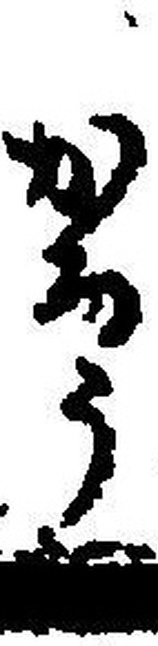かろう
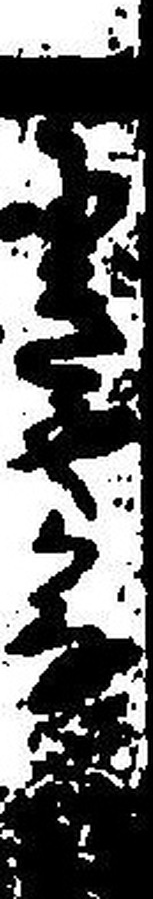にぎやかな
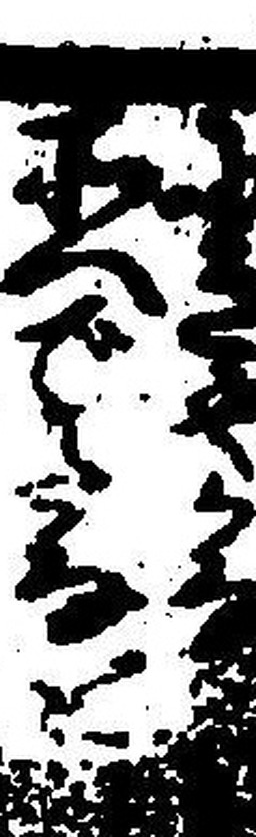所へでたなを
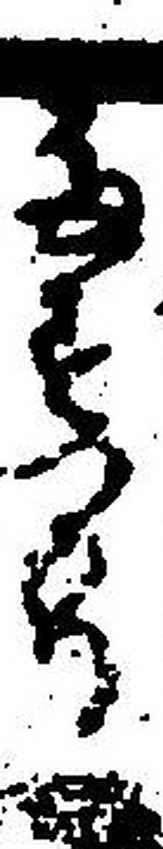たすつもり
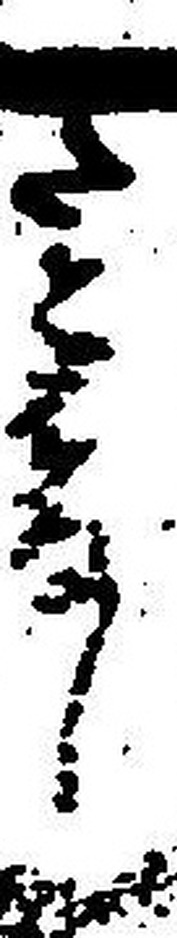たとはなし
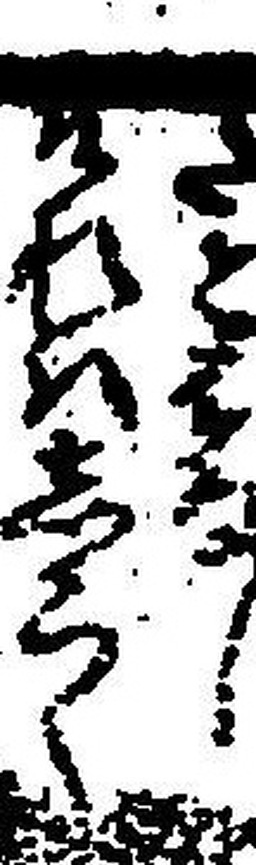けれはしこく
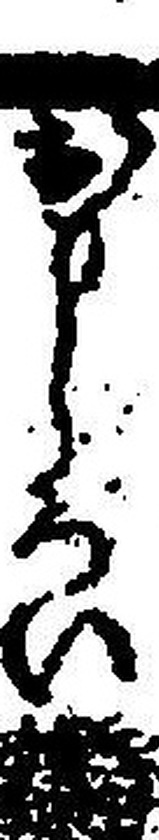おもしろい
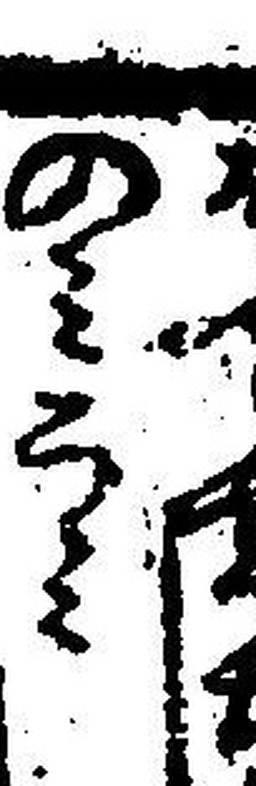のみこみ
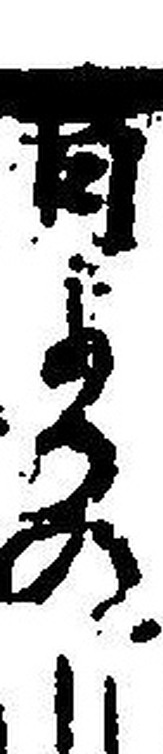日よりの
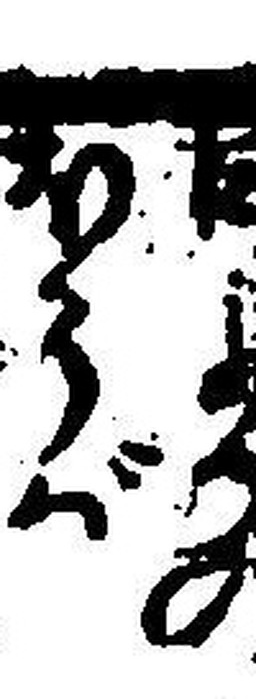ほうが
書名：天竺儲之筋 / 市場通笑作
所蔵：東京大学総合図書館 General Library in the University of Tokyo, JAPAN
